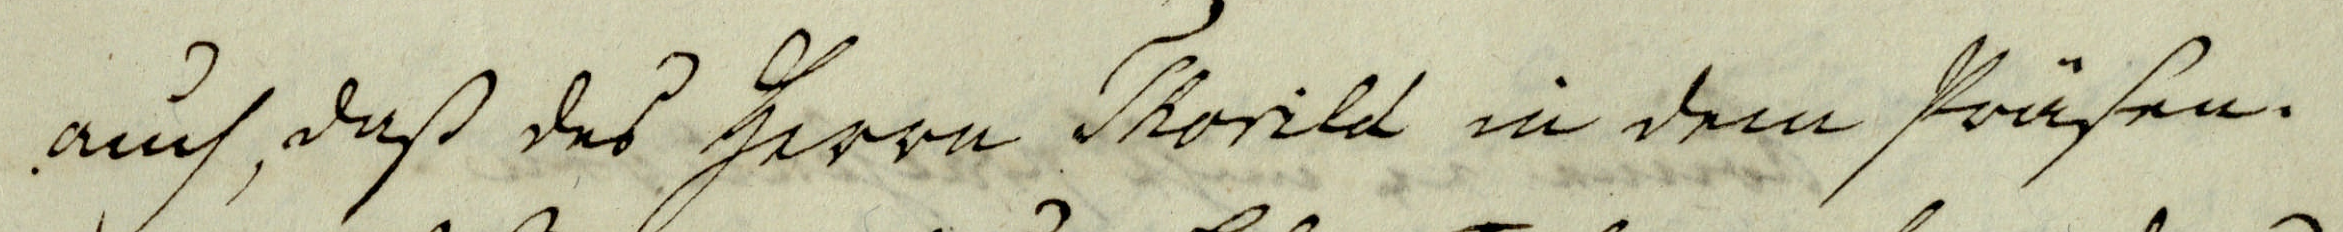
auch, daß des Herrn Thorild in dem Präsen¬
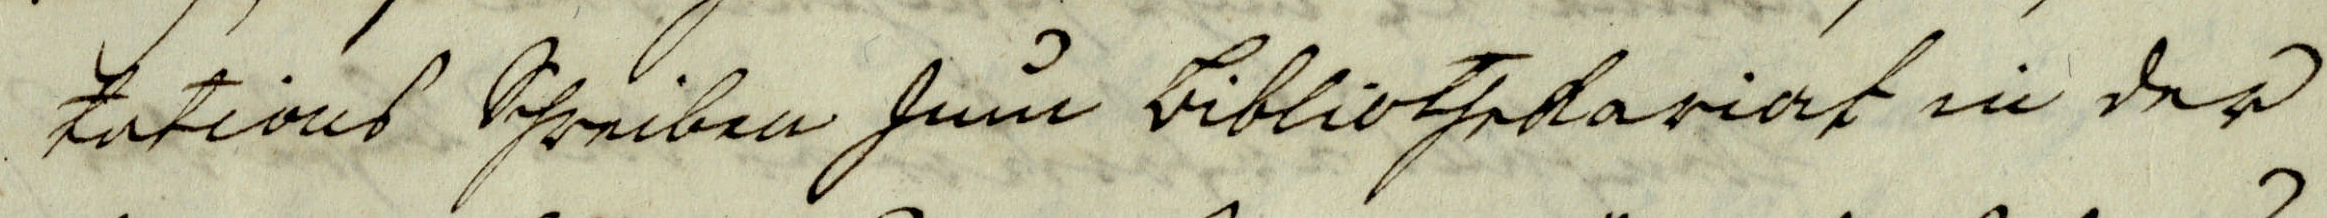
tations Schreiben zum Bibliothekariat in der
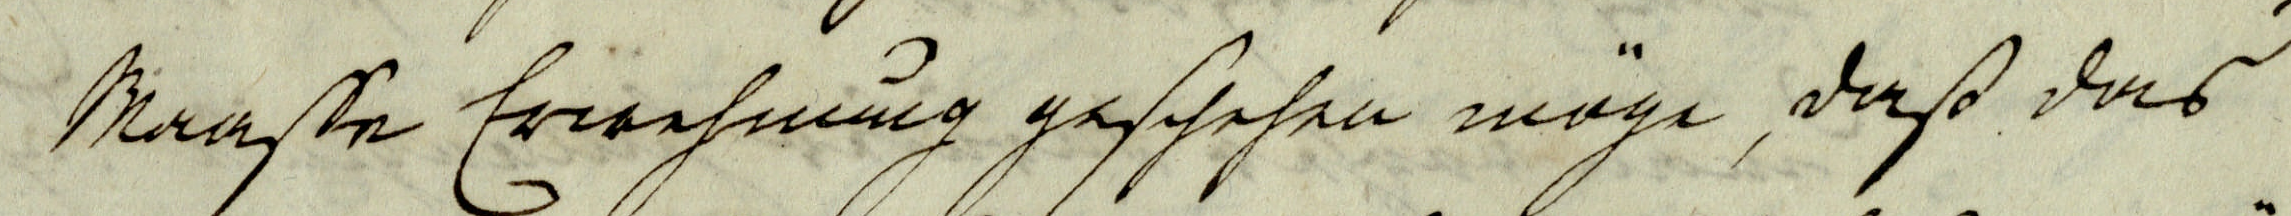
Maasse Erwehnung geschehen möge, daß das
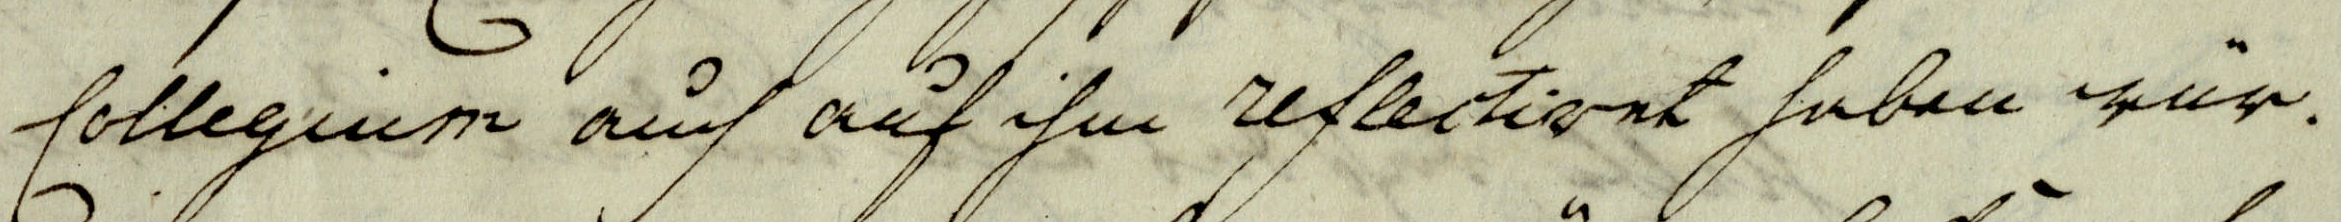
Collegium auch auf ihm reflectiret haben wür¬
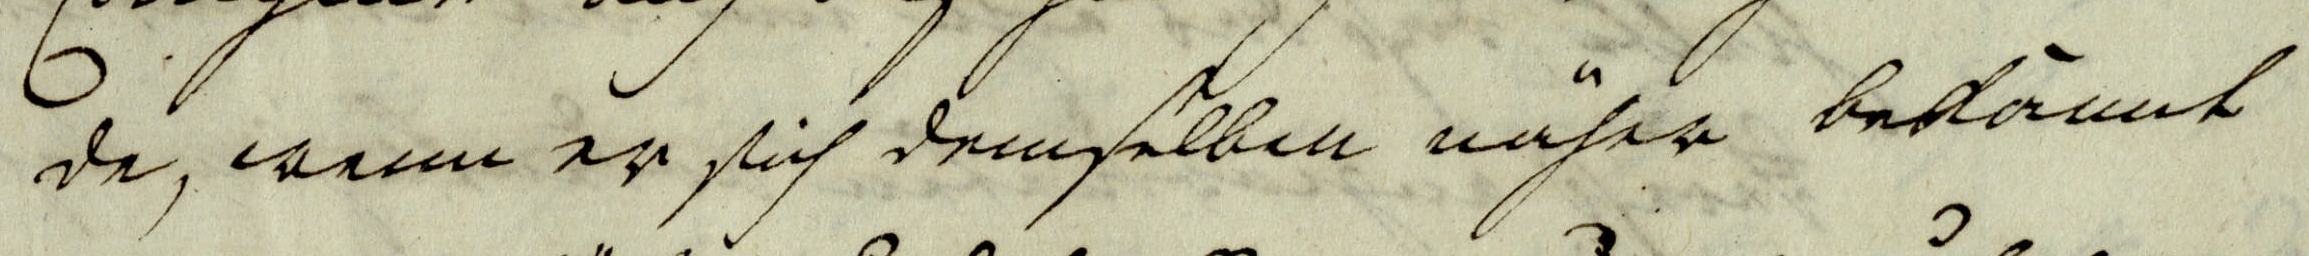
de, wenn er sich demselben näher bekannt
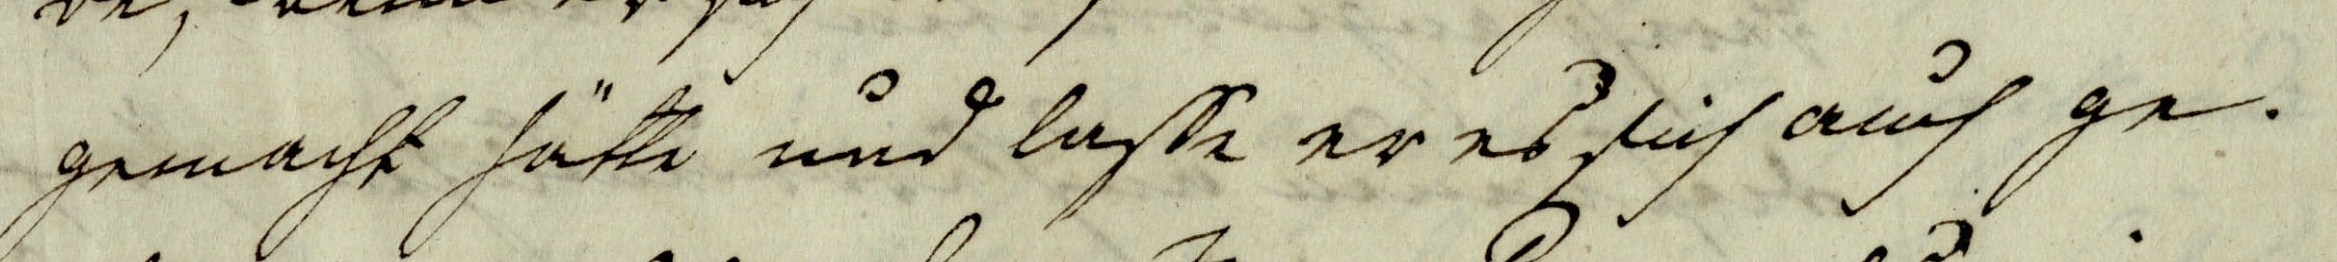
gemacht hätte und lasse er es sich auch ge¬
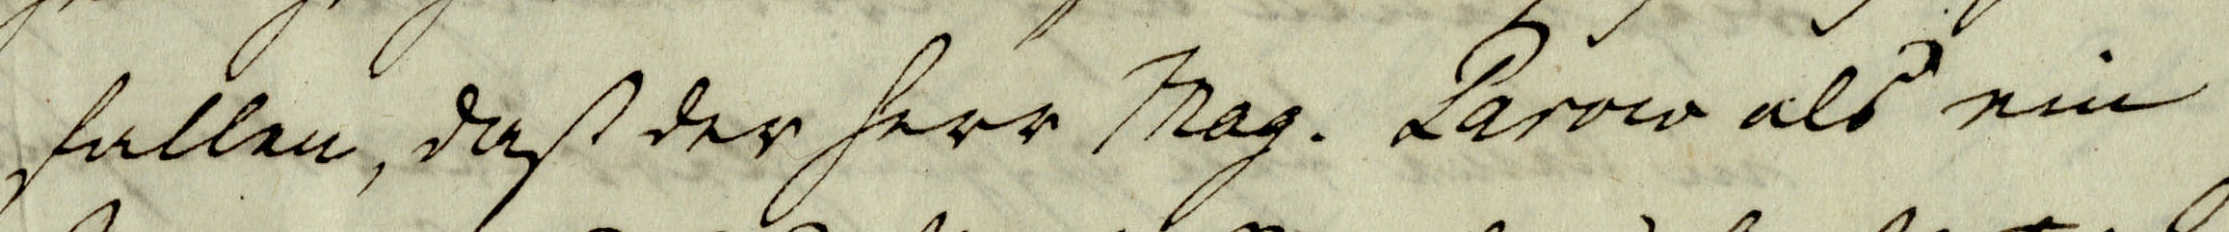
fallen, daß der Herr Mag. Larow als ein
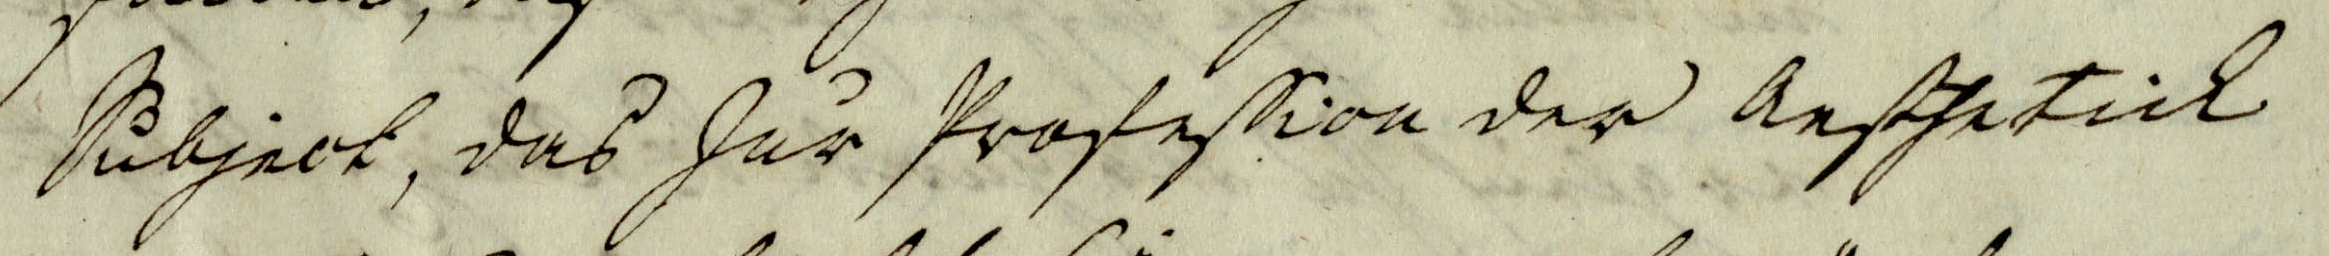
Subject, das zur Profession der Aesthetick
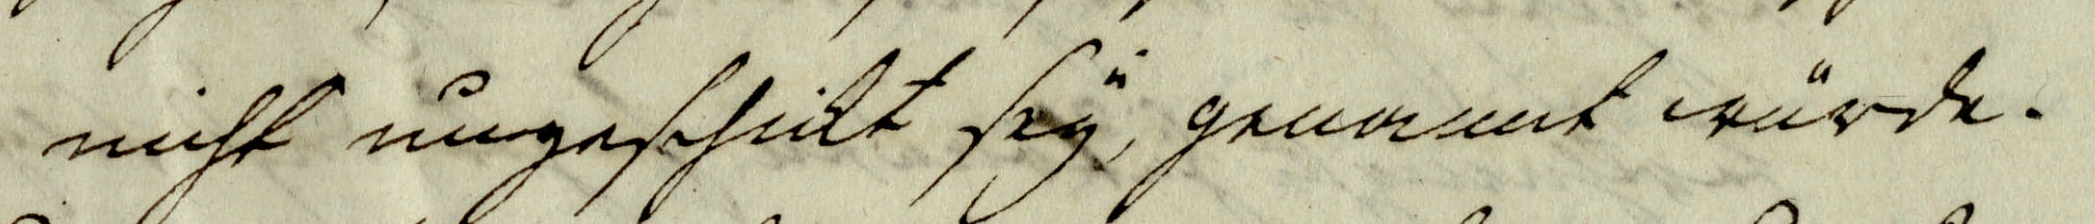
nicht ungeschickt seÿ, genannt würde.
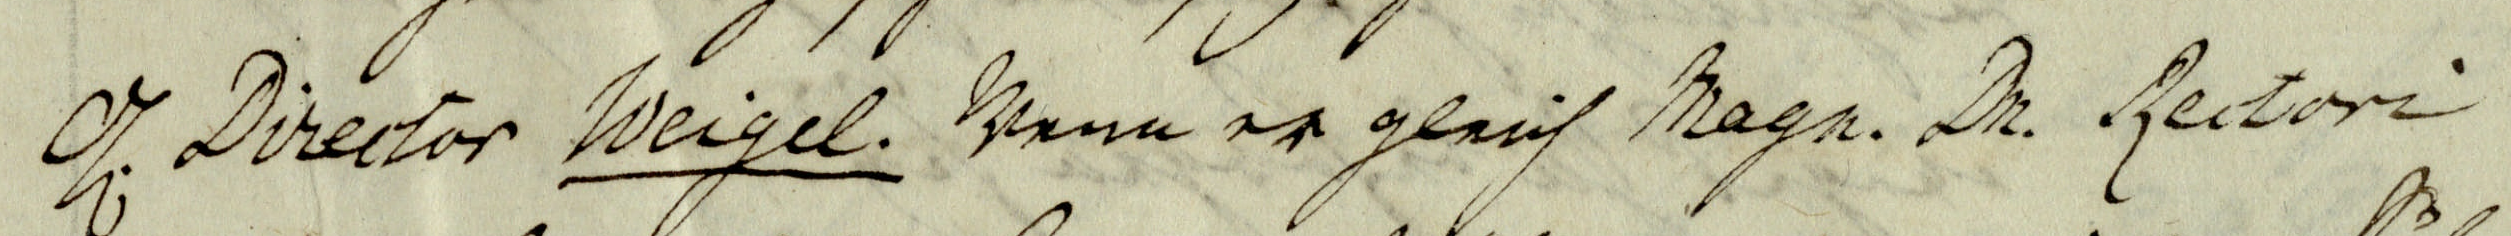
dh. Director Weigel. Wenn er gleich Magn. Dn. Rectori
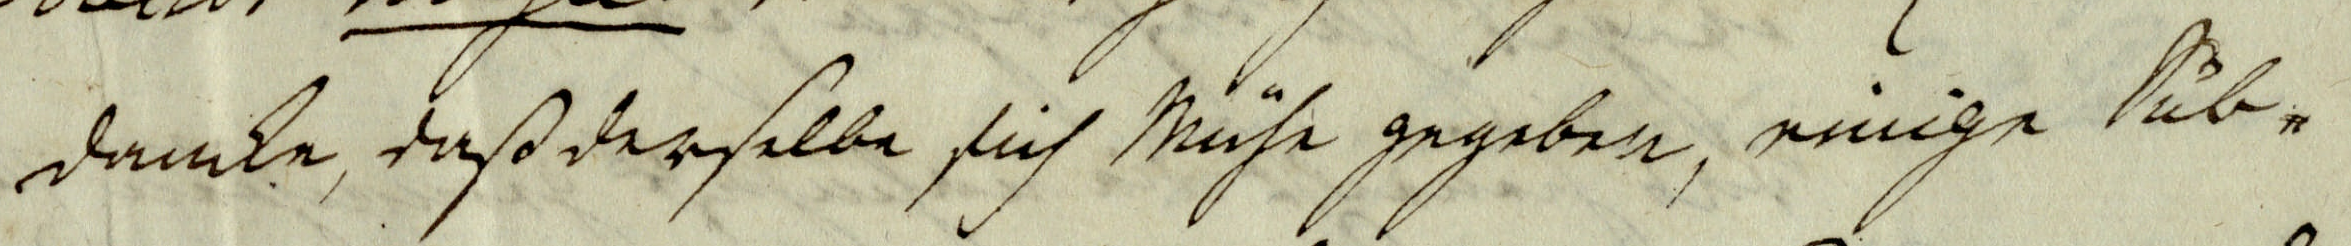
dancke, daß derselbe sich Mühe gegeben, einige Sub¬
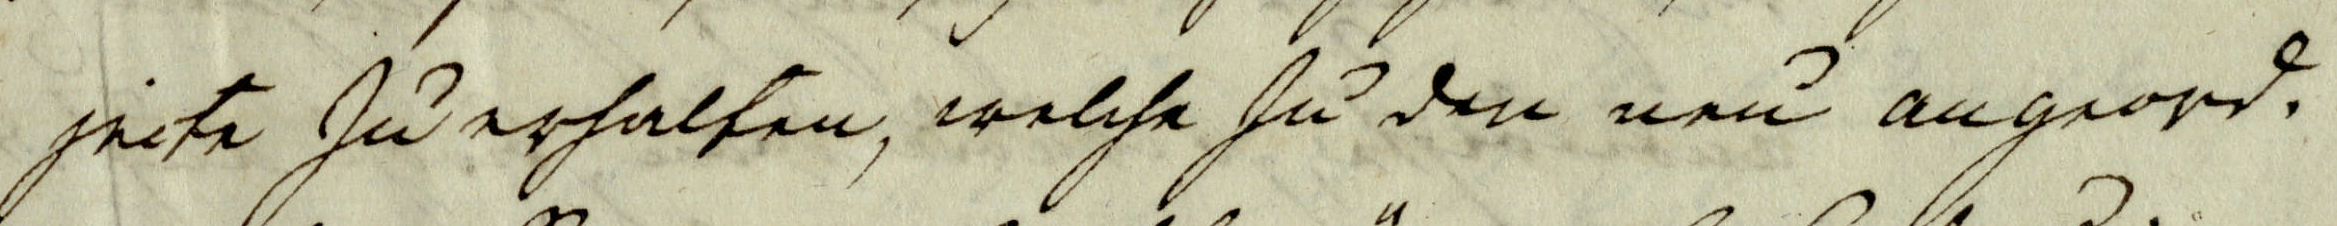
jecte zu erhalten, welche zu den neu angeord¬
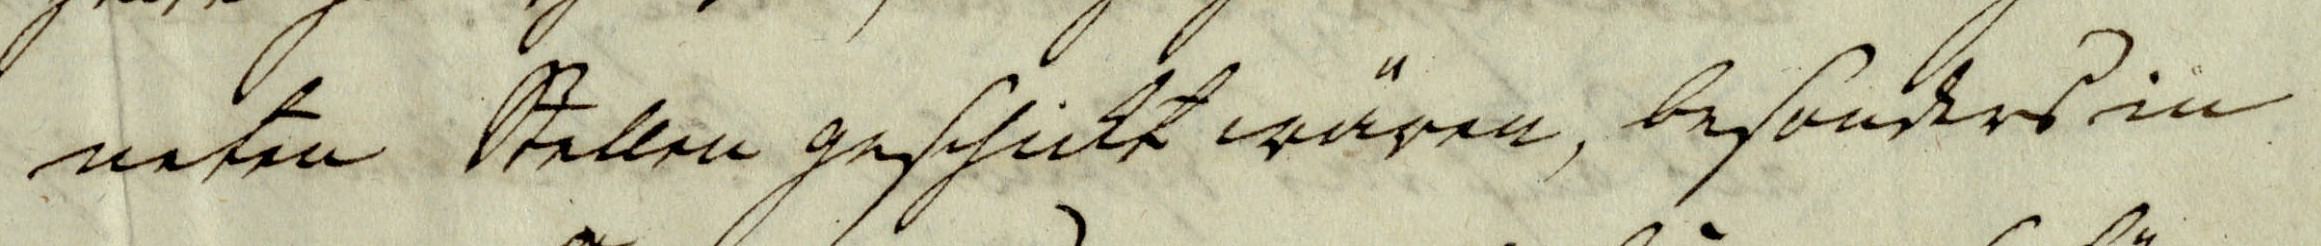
neten Stellen geschickt wären, besonders in
